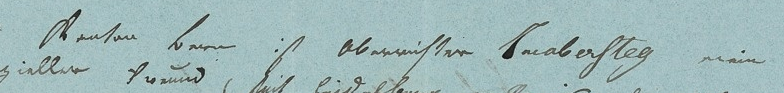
Kanton Bern ist Oberrichter Imobersteg mein
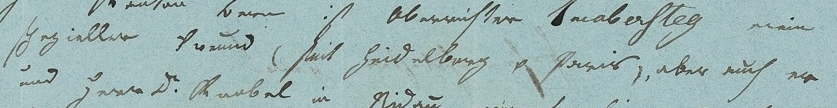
spezieller Freund (seit Heidelberg & Paris), aber auch er
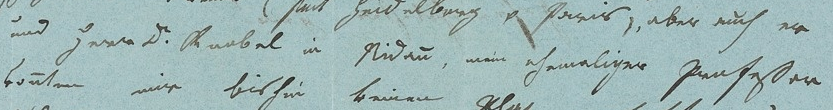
und Herr D Knobel in Nidau, mein ehemaliger Professor
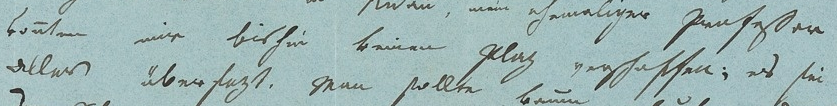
konnten mir bishin keinen Plaz verschaffen; es sei
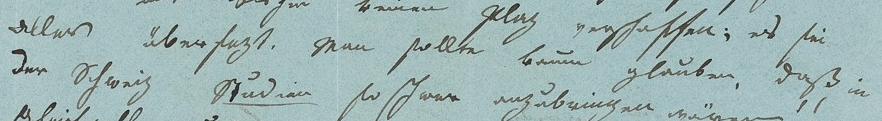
alles übersezt. Man sollte kaum glauben, daß in
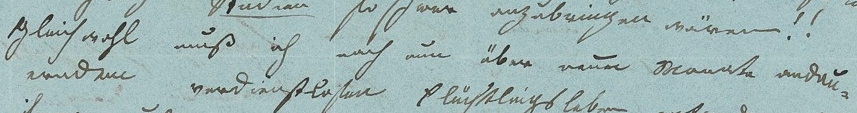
Gleichwohl muß ich nach nun über neun Monate andau-
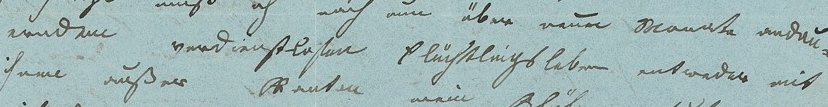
erndem verdienstlosen Flüchtlingsleben entweder mit
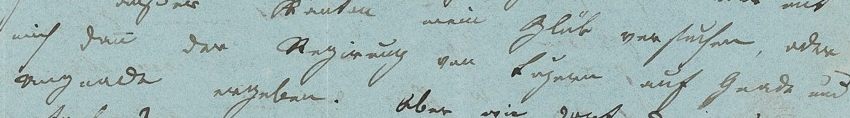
mich dann der Regirung von Luzern auf Gnade und
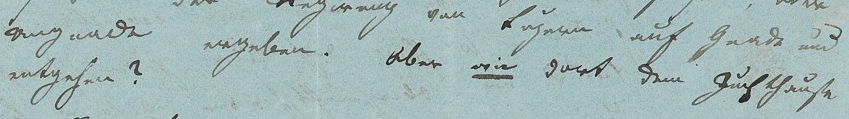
Ungnade ergeben. Aber wie dort dem Zuchthause
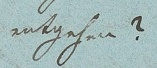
entgehen?
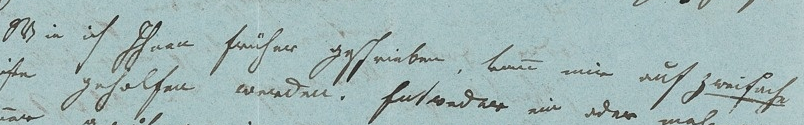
Wie ich Ihnen früher geschrieben, kann mir auf zweifache
